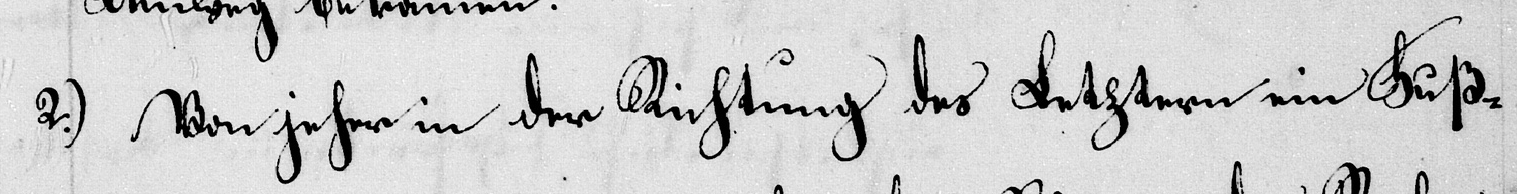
2.) Von jeher in der Richtung des Letztern ein Fuß¬
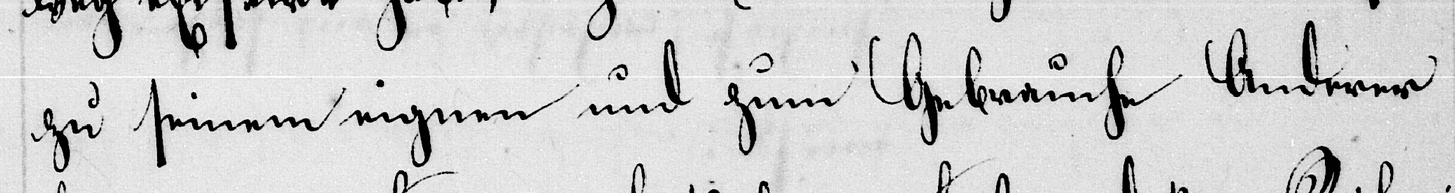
zu seinem eignen und zum Gebrauche Anderer
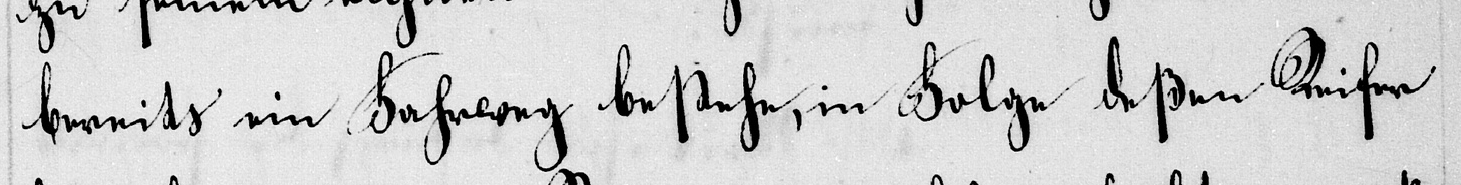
bereits ein Fahrweg bestehe, in Folge deßen Reifer
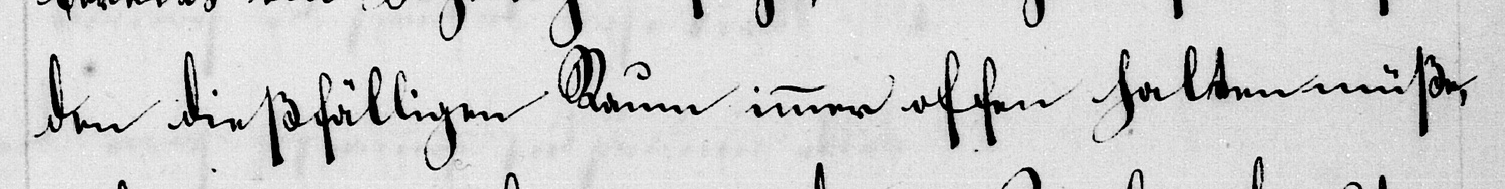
den dießfälligen Raum immer offen halten müße,
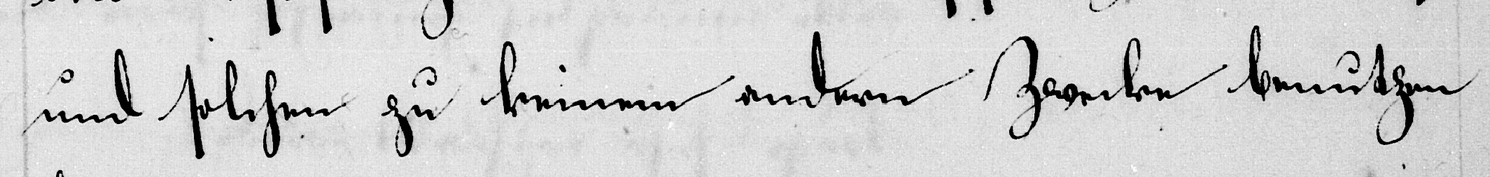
und solchen zu keinem andern Zwecke benutzen
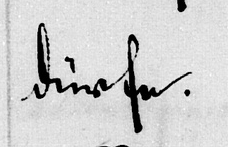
dürfe.
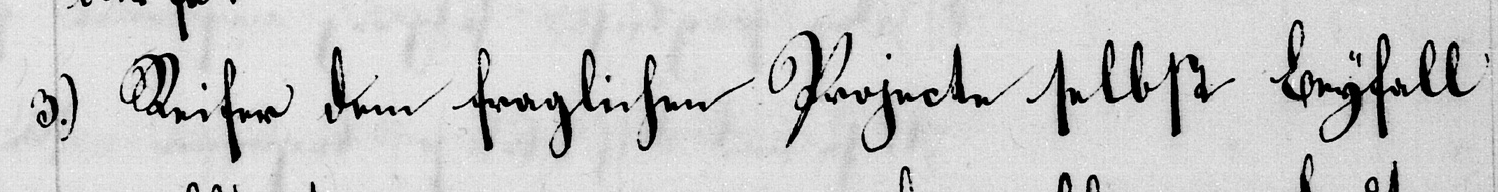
3.) Reifer dem fraglichen Projecte selbst Beyfall
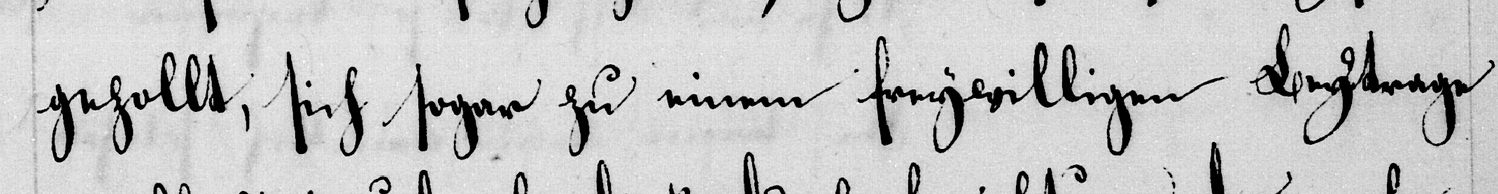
gezollt, sich sogar zu einem freywilligen Beytrage
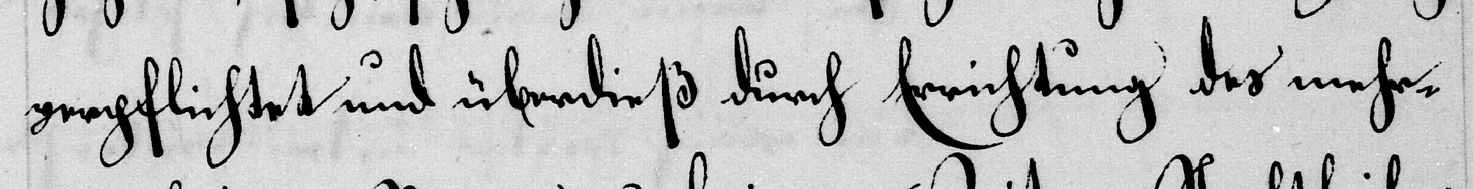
verpflichtet und überdieß durch Errichtung des mehr¬
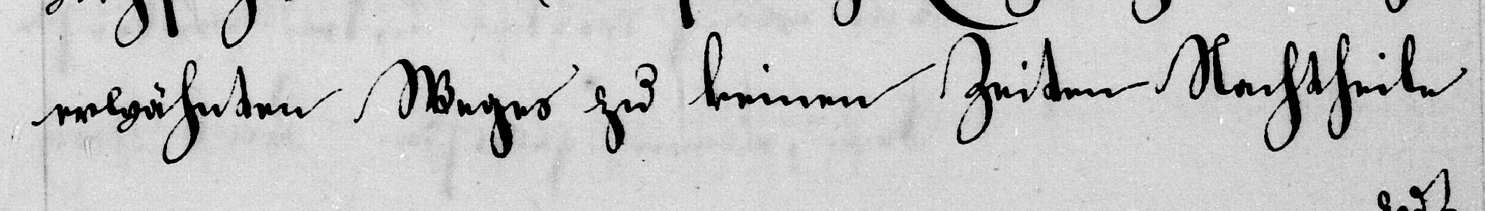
erwähnten Weges zu keinen Zeiten Nachtheile
